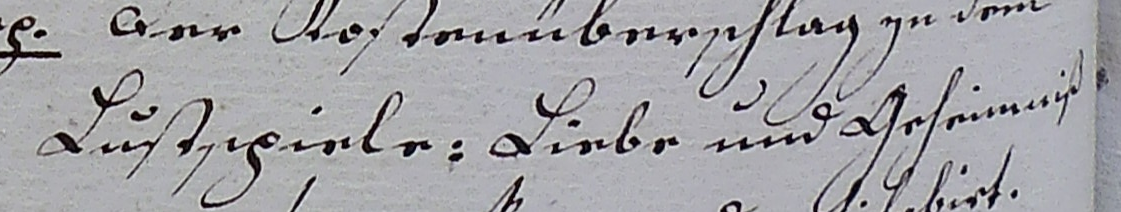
Lustspiele: Liebe und Geheimniß
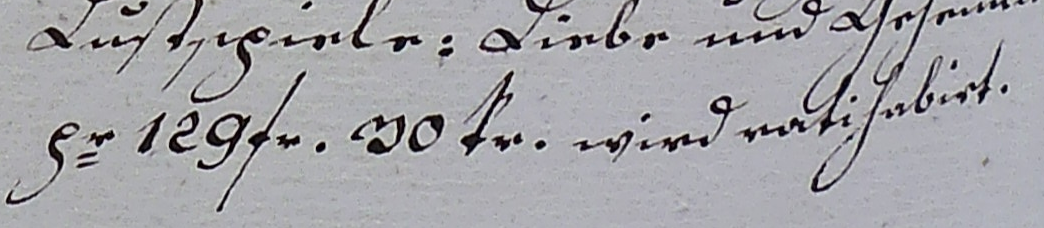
pr͇ 129fr. 30kr. wird ratihabirt.
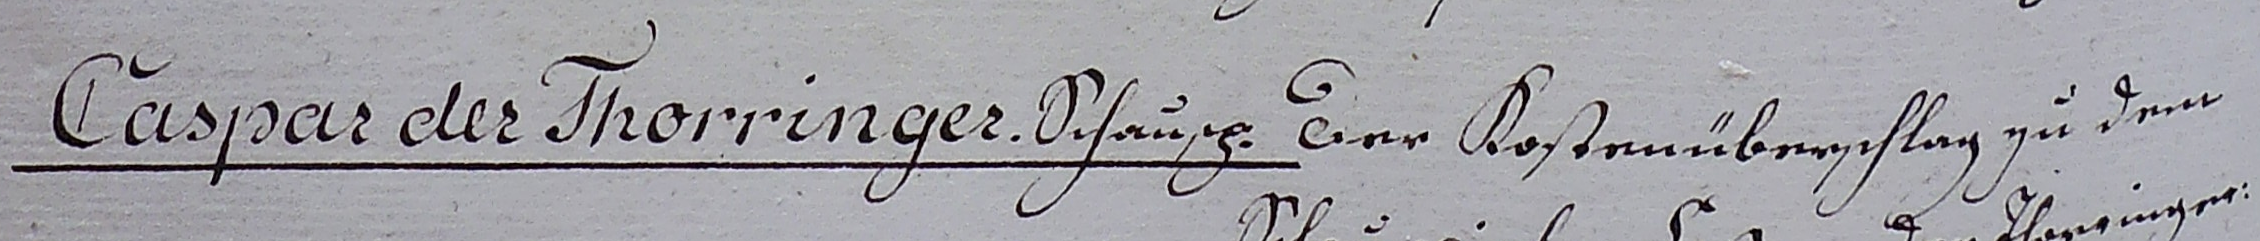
Caspar der Thorringer, Schausp. Der Kostenüberschlag zu dem
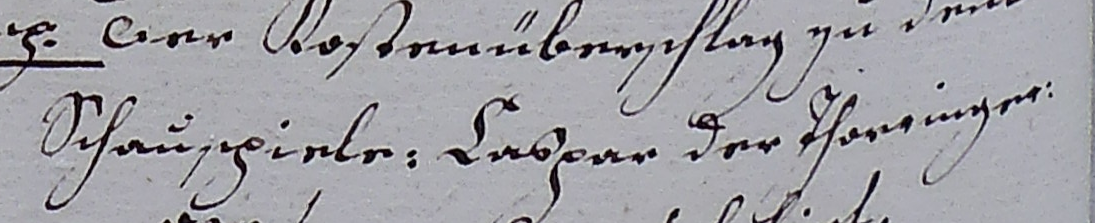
Schauspiele: Caspar der Thorringer:
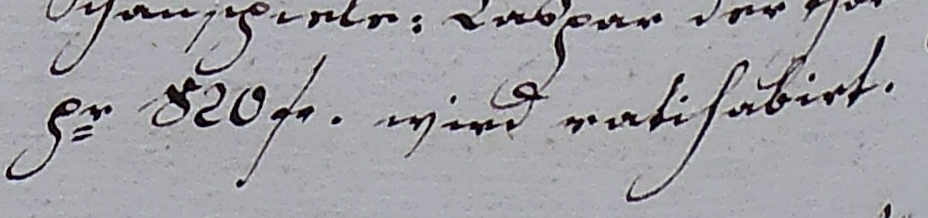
pr͇ 820fr. wird ratihabirt.
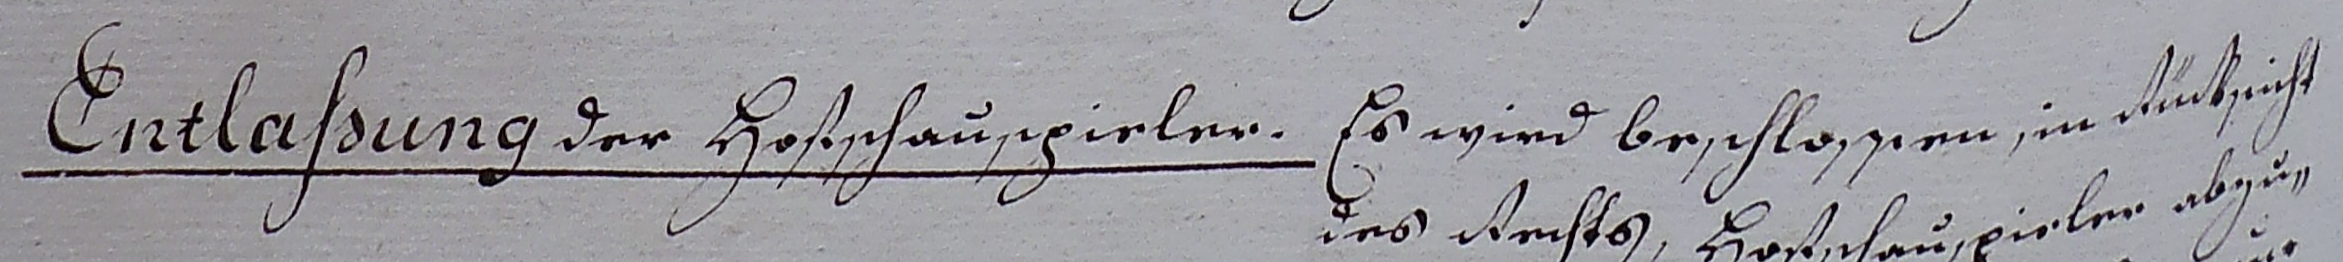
Entlassung der Hofschauspieler. Es wird beschlossen, in Rücksicht
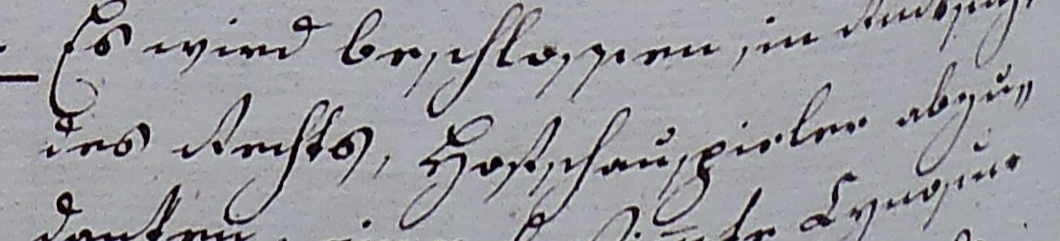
des Rechts, Hofschauspieler abzu¬
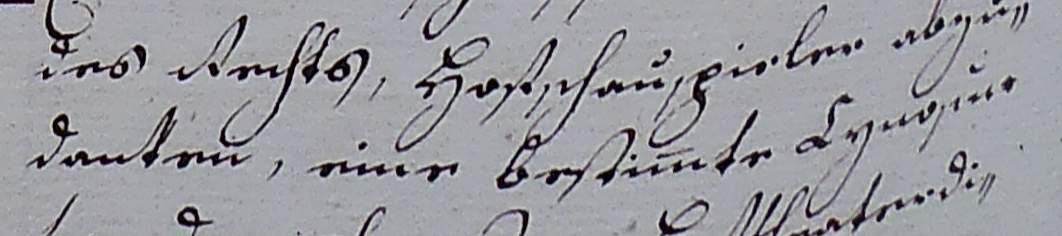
danken, eine bestim̅te Cynosur
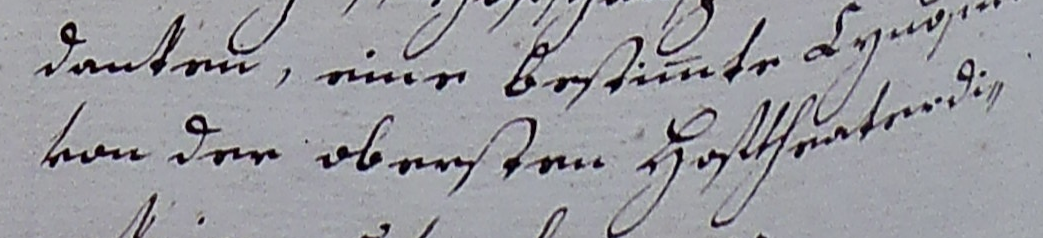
von der obersten Hoftheaterdi¬
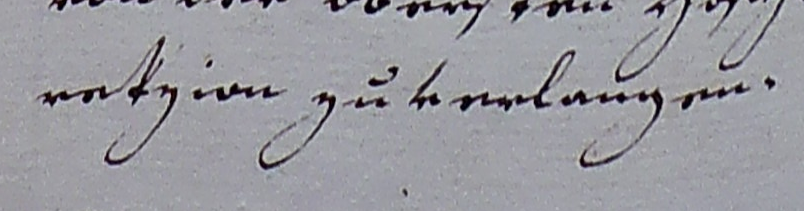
rekzion zuverlangen.
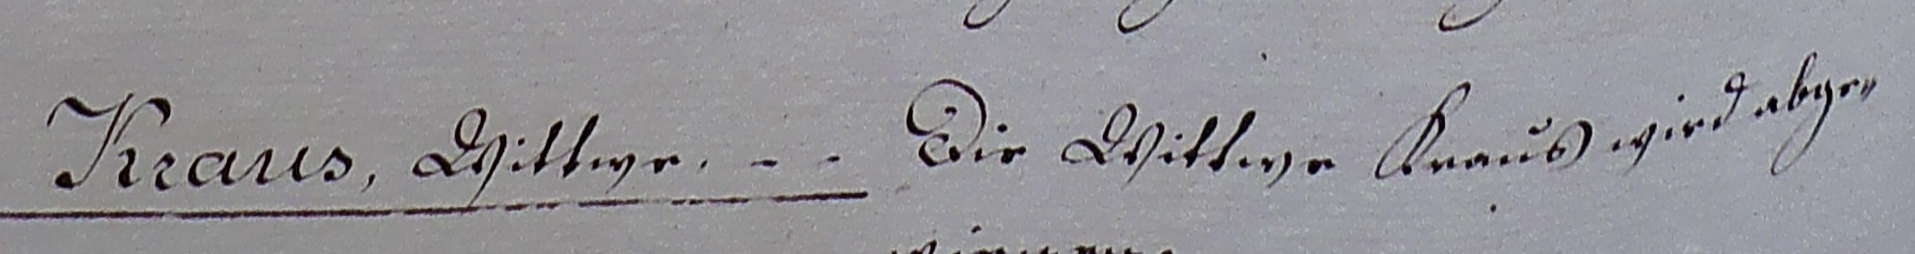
Kraus, Wittwe. .. . Die Wittwe Kraus wird abge¬
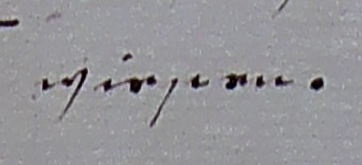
wiesen.
